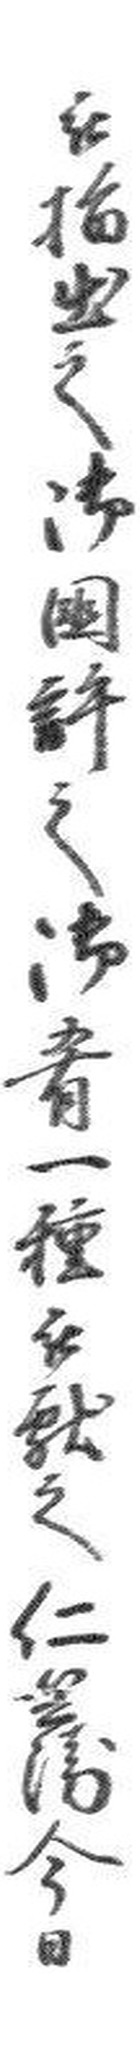被指出之御国許之御肴一種被献之仁兵衛今日
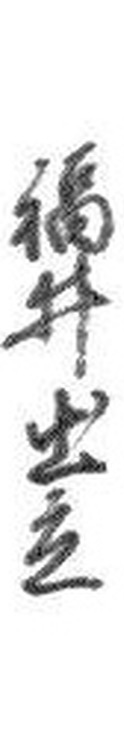福井出立
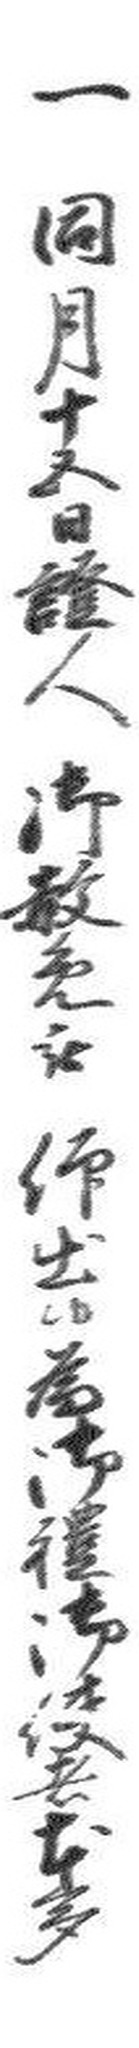一同月十五日証人御赦免被仰出候為御礼御使者本多

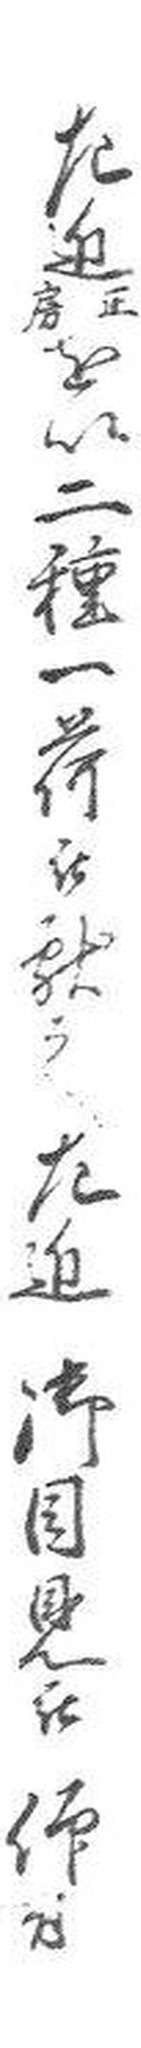左近正房を以二種一荷被献之左近御目見被仰付
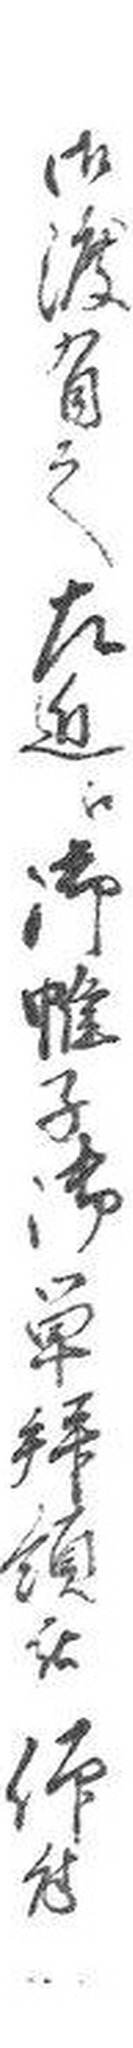御渡有之左近江御帷子御単拝領被仰付
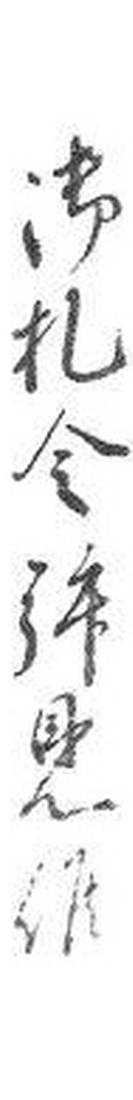御札令拝見候
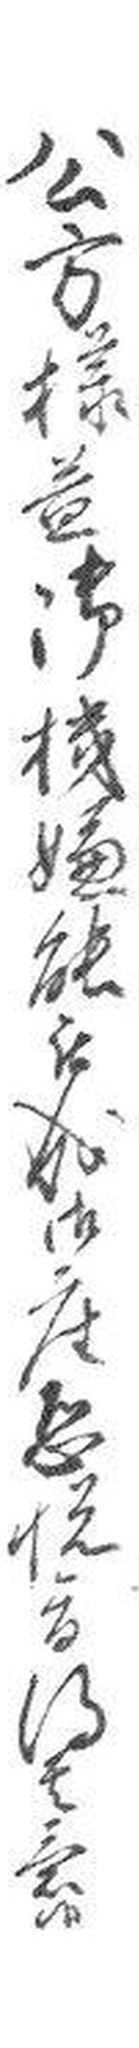公方様益々御機嫌能被成御座恐悦之旨得其意候
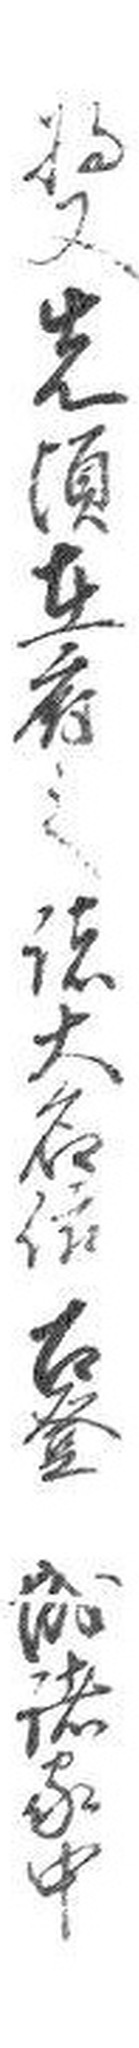将又先頃在府之諸大名依召登城諸家中
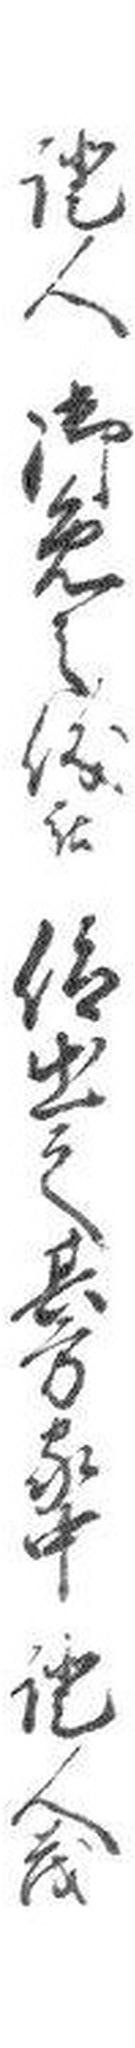証人御赦免之儀被仰出之其方家中証人之儀茂
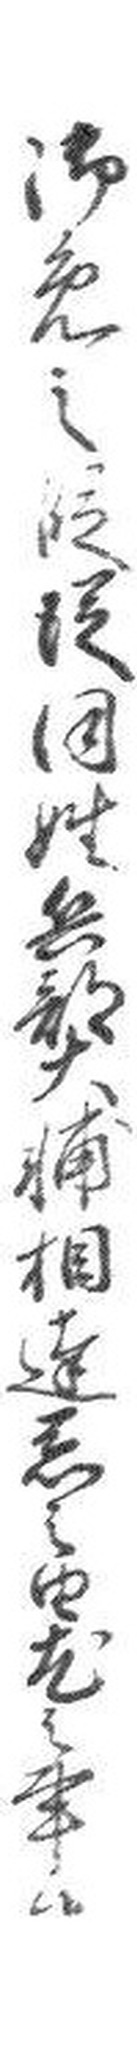御免之段従同姓兵部大輔相達着之由尤之事候
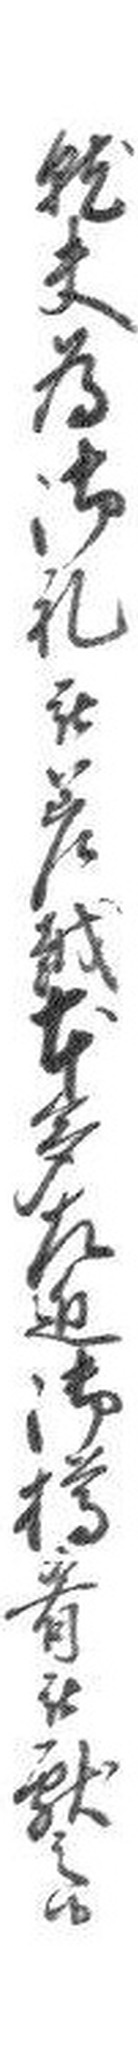就夫為御礼被差越本多左近御樽肴被献之候
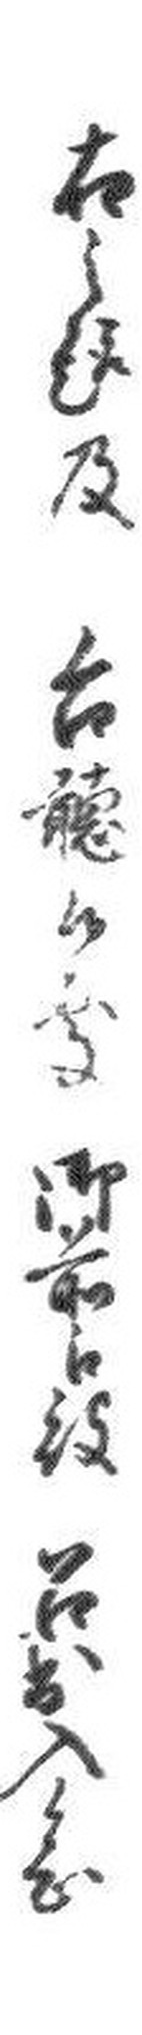右之趣及台聴候処御前江被召出入念
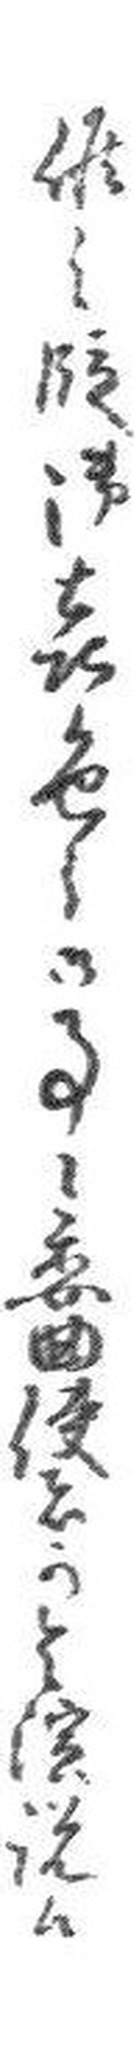候之段御喜色之御事候委曲者可令演説候
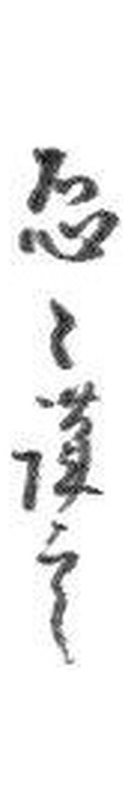恐々謹言
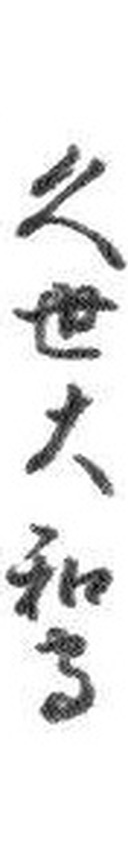久世大和守
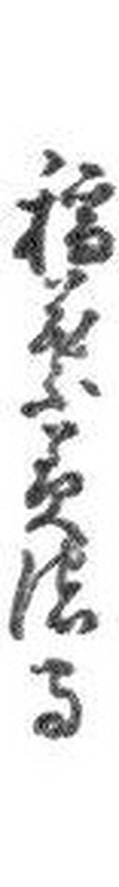稲葉美濃守
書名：家譜 七 光通公 従寛文四年到同九年
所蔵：福井県文書館 Fukui Prefectural Archives
